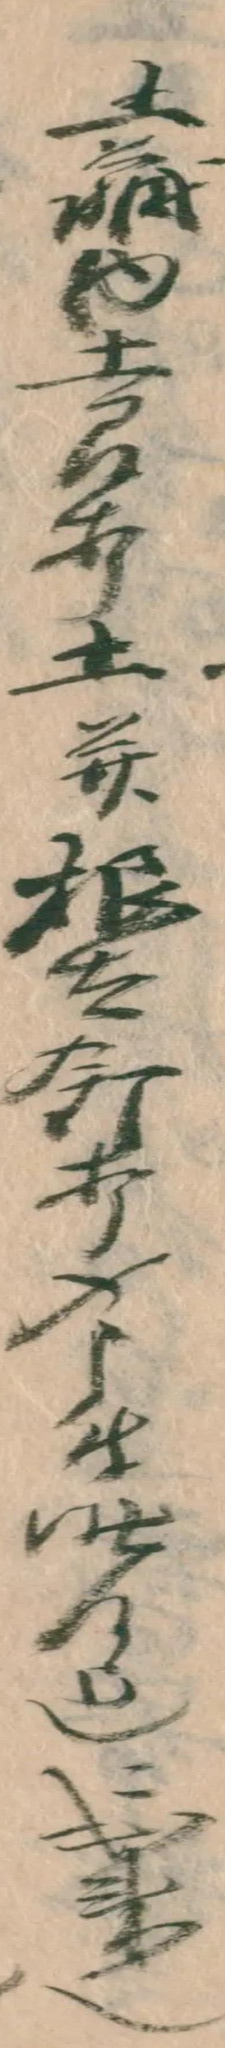土蔵内土間打土幷根太釘打〆申付昨月迄に出来也
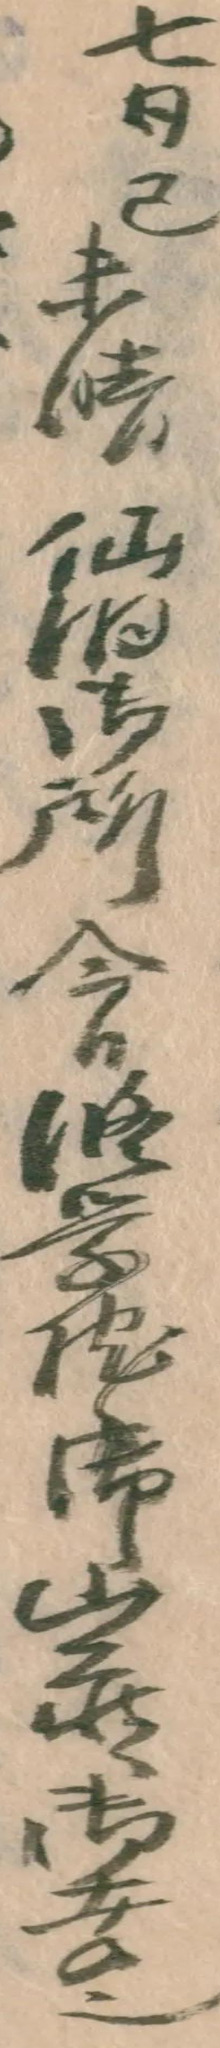七日己未晴仙洞御所今日修学院滞山荘へ御幸也
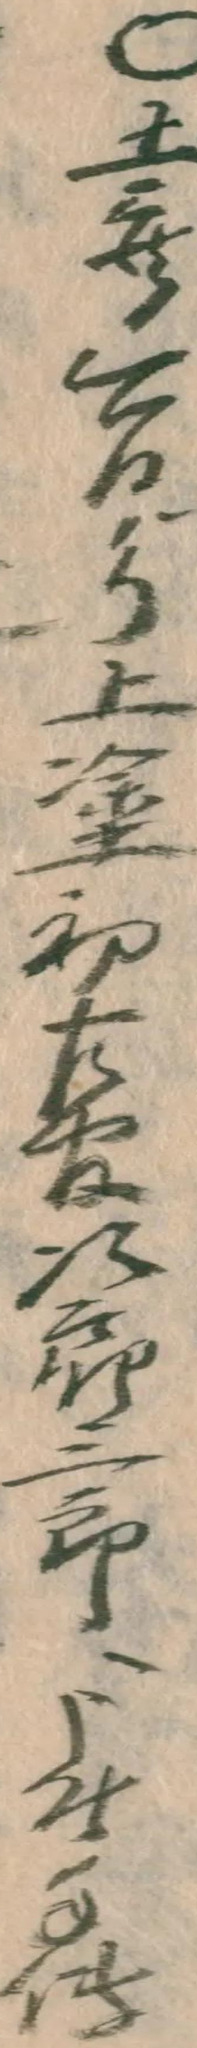○土蔵今日より上塗初左官次郎三郎へ申付手傳
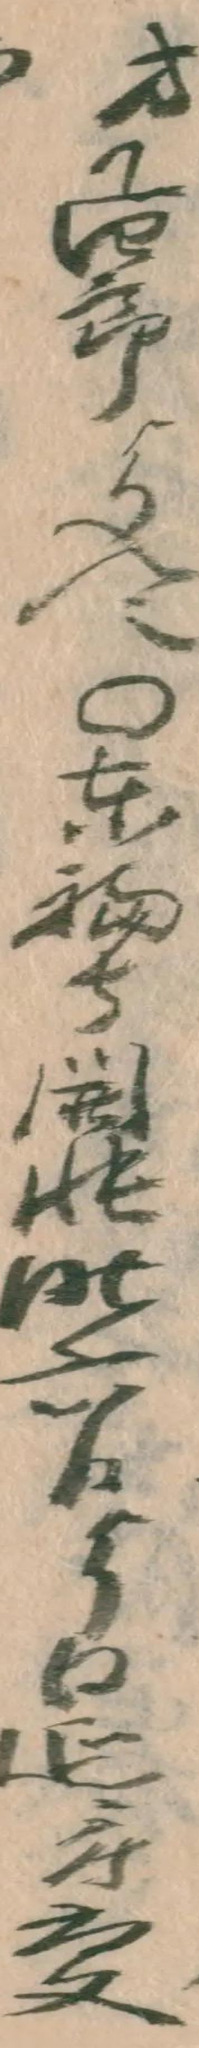方乙四郎より入也○東福寺開帳昨六右より日延ニ付尚又
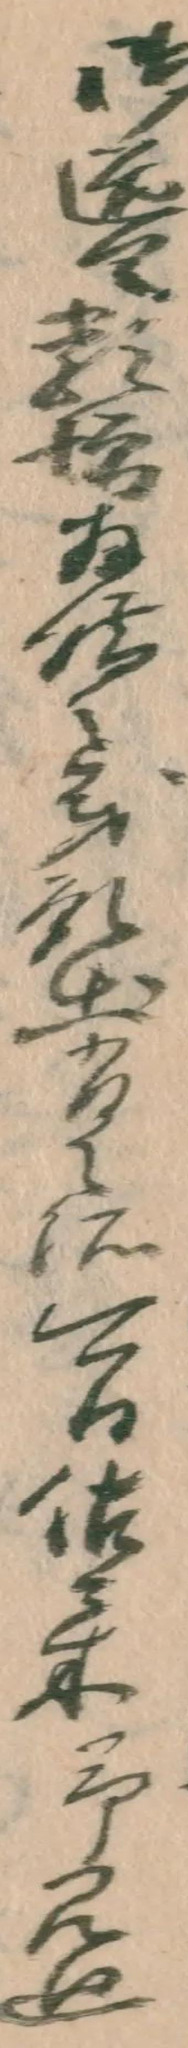御医具類増拝借之義願出有之所今日佐々木予見廻
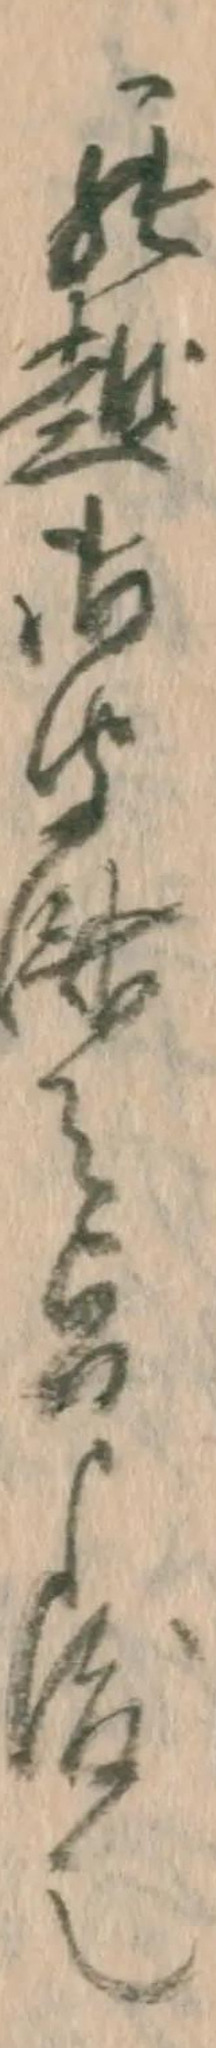罷越御聞済之旨申渡也
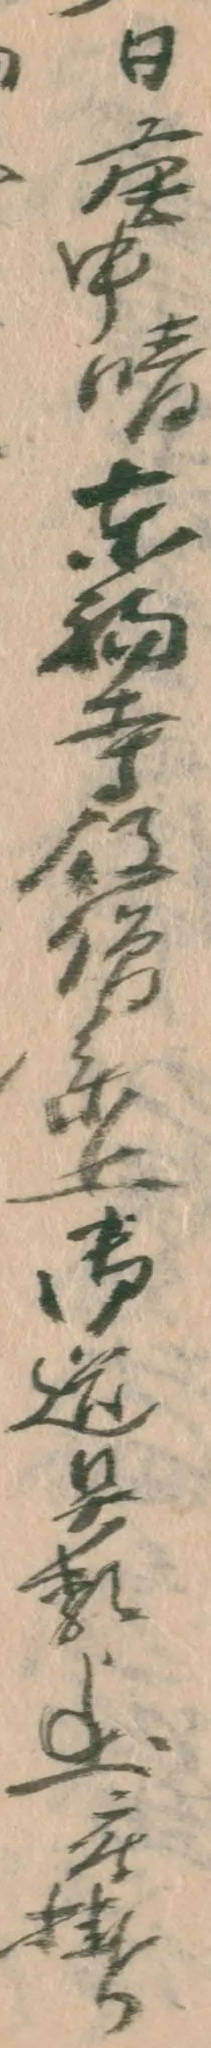八日庚申晴東福寺役僧参上御道具類申出ニ付掛リ
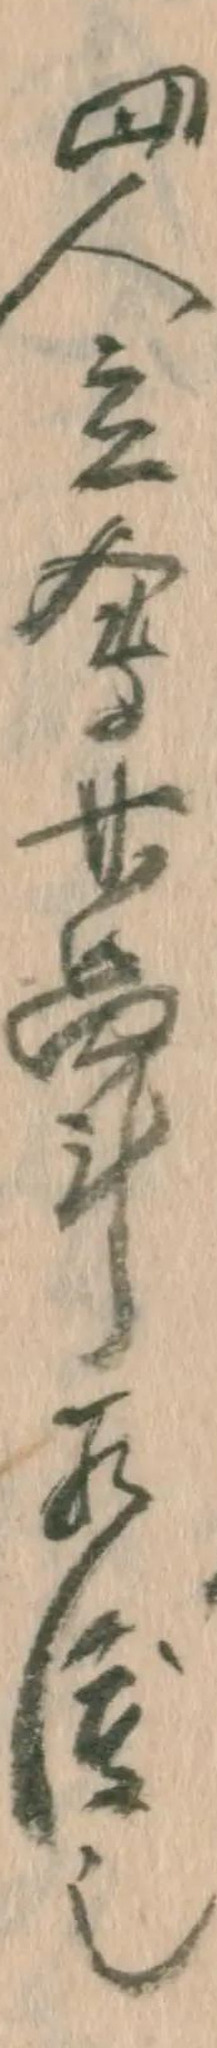四人立會廿品斗相渡之
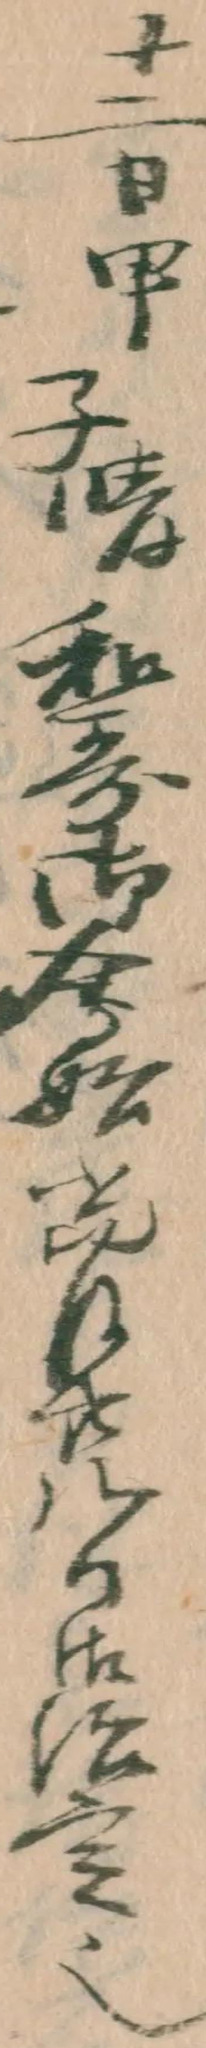十二日甲子晴和歌御會始當月廿八日御治定也
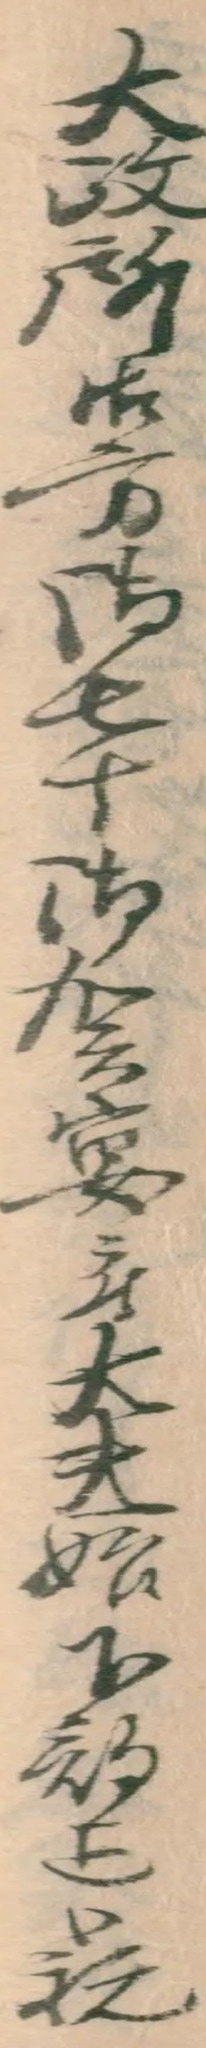大政所御方御七十御賀宴ニ付大夫始下部迄御祝
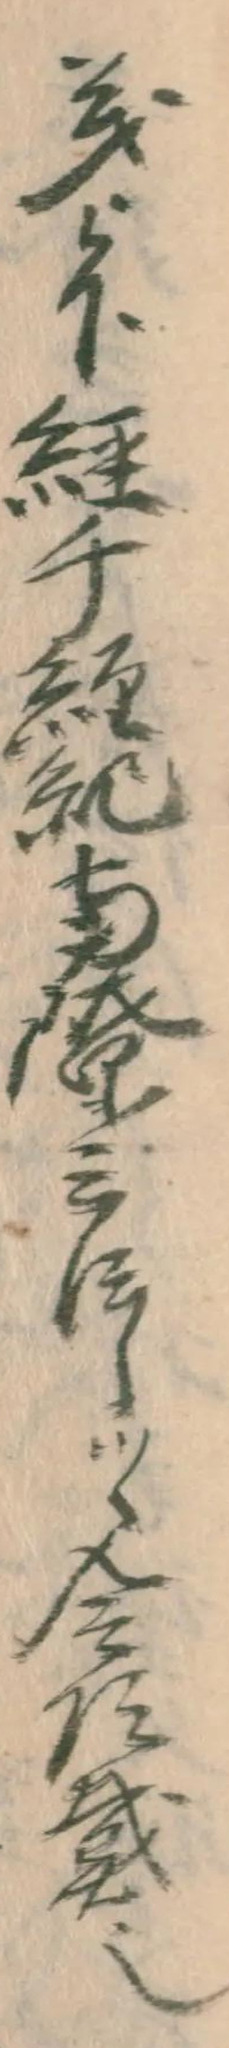義被下経千経紀南鐐三片ツヽ令頂戴也
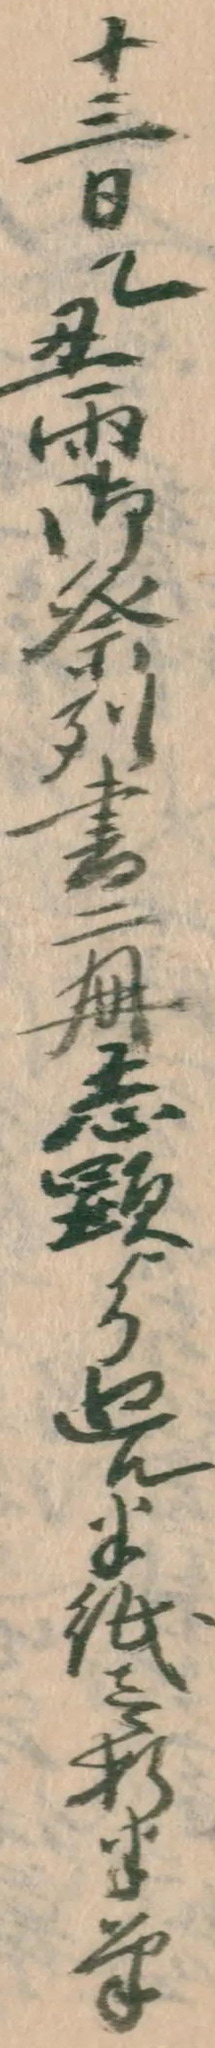十三日乙丑雨御祭列書二冊志顕より廻ル半紙壱枚半筆
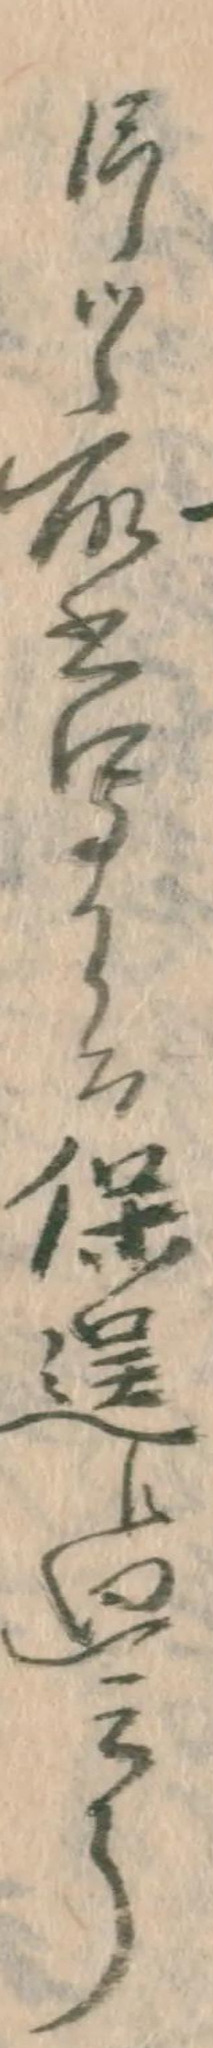片ツヽ取書写了而保選え廻云事
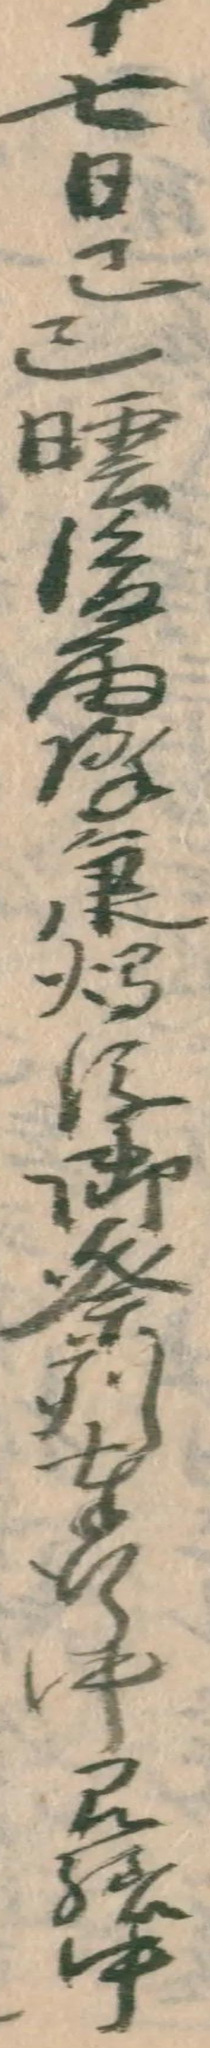十七日己巳曇後雨降兵食秉燭後御祭列奉行仲間郷中
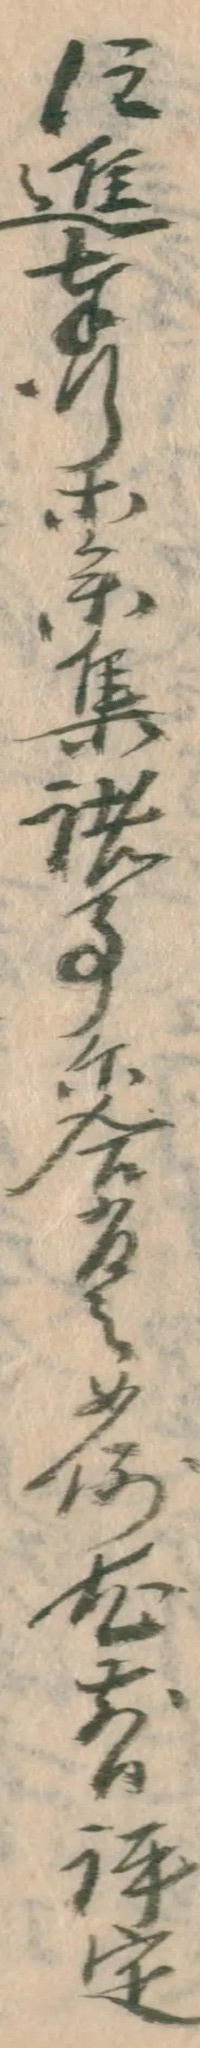注進奉行未参集諸事参會有之如例尤前日評定
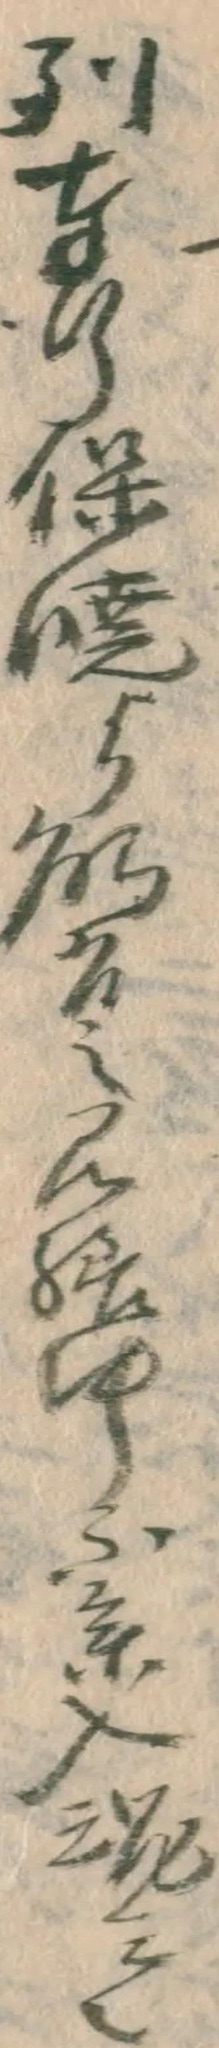列奉行保暁より觸有之見繕郷中不参入魂云々
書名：賀茂社記録. 第67冊
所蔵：国立国会図書館 National Diet Library, JAPAN
